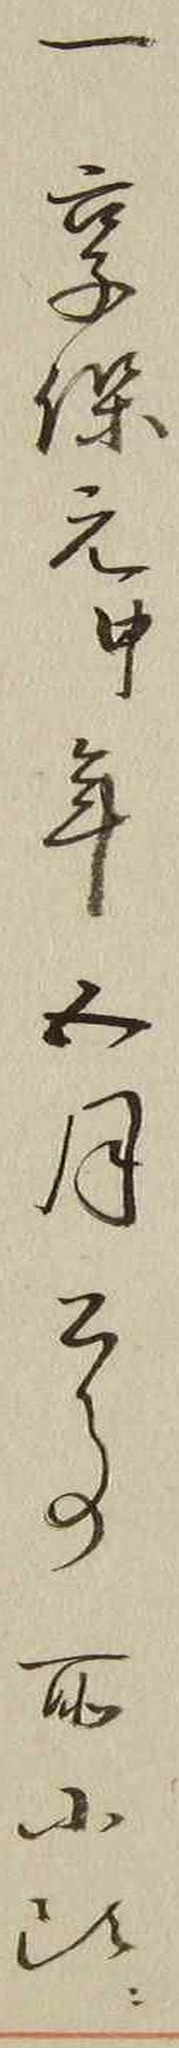一享保元申年五月公事所小頭ニ
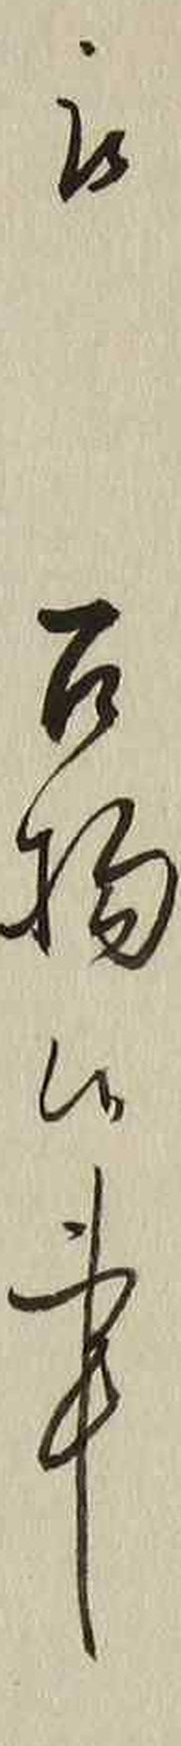被召抱候事
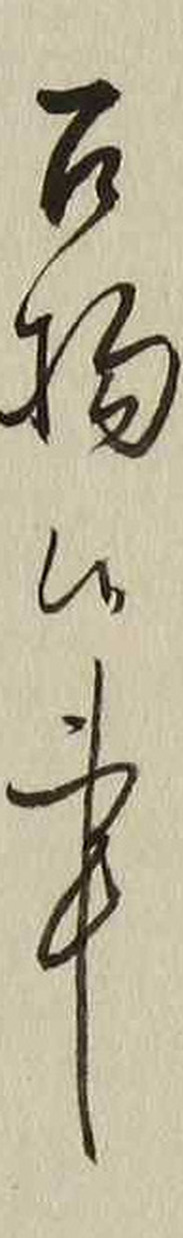召抜候事
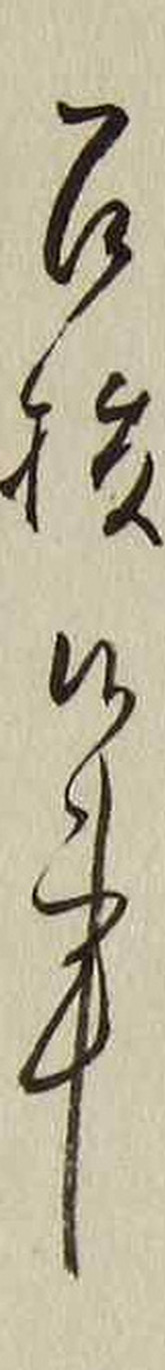召抜候事
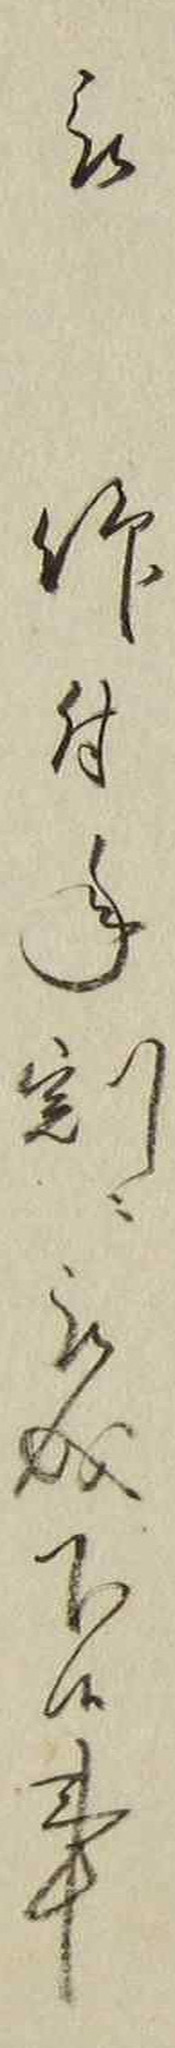被仰付年割ニ被成下候事
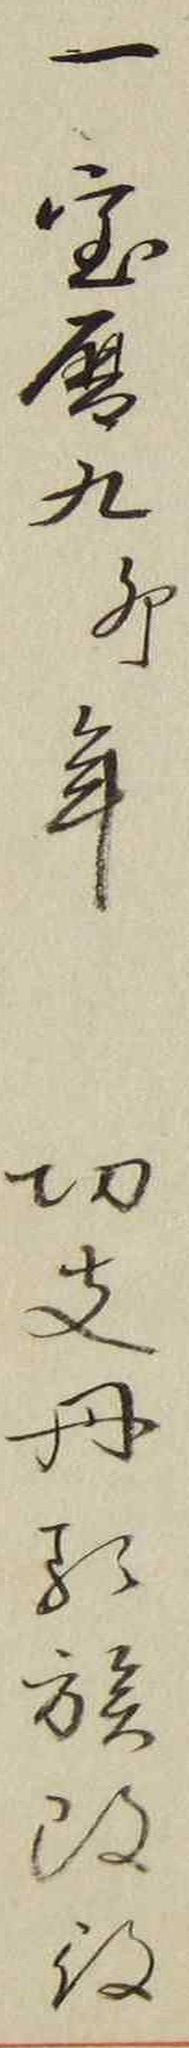一宝暦九卯年切支丹類族改役

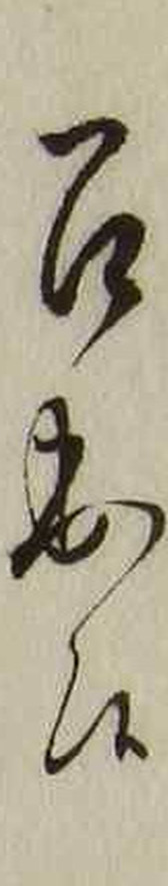召出候
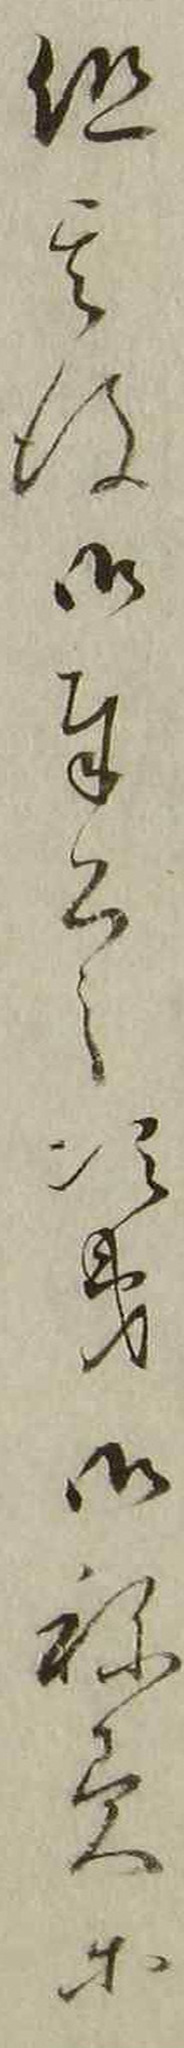但其後御奉公之次第御称美等
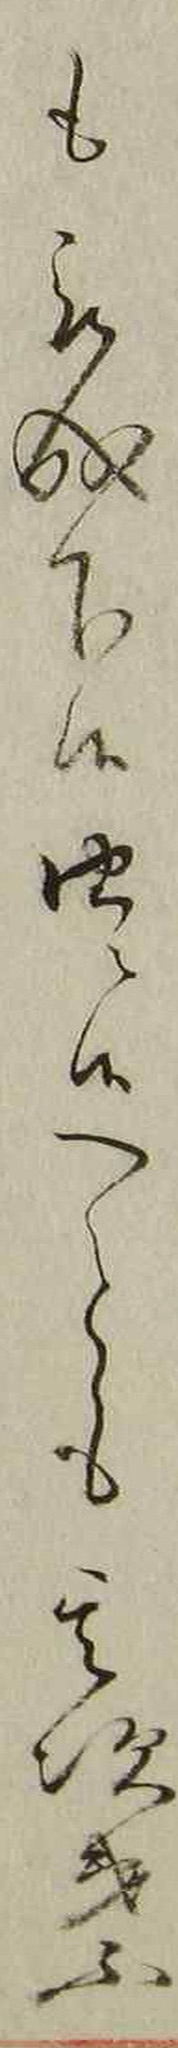も被成下候由に候へとも其次第不
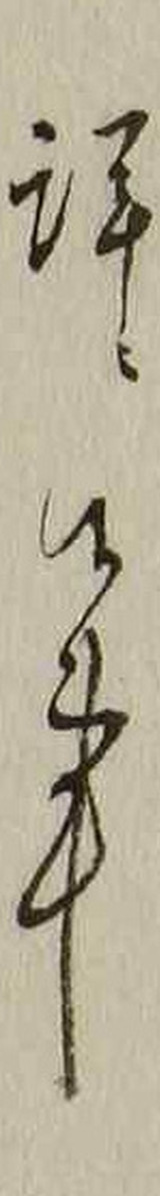詳ニ候事
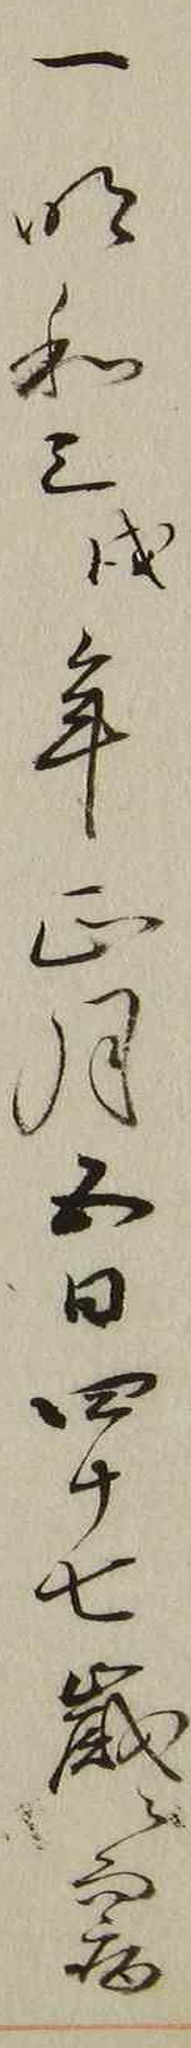一明和三戌年正月五日四十七歳ニ而病
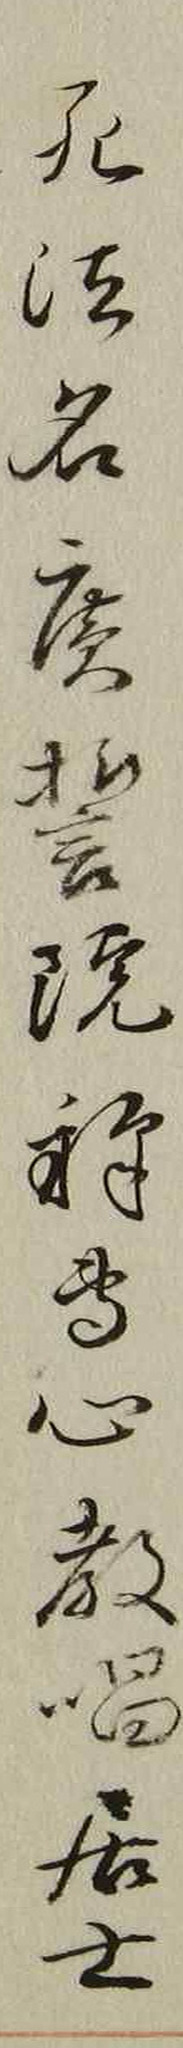死法名広誓院釈専心教唱居士
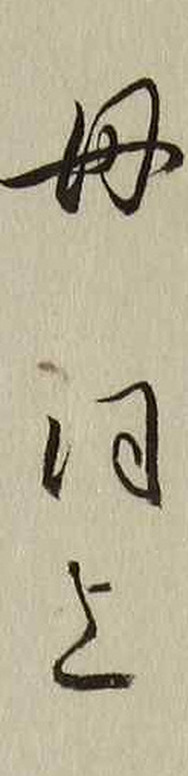母同上
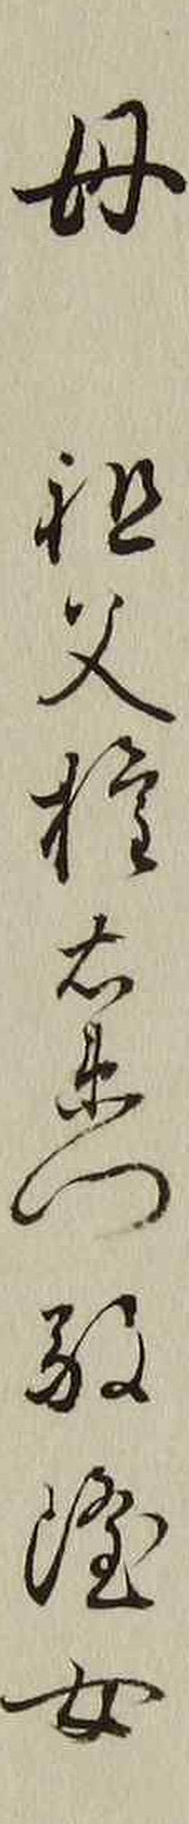母祖父権右衛門敬隆女

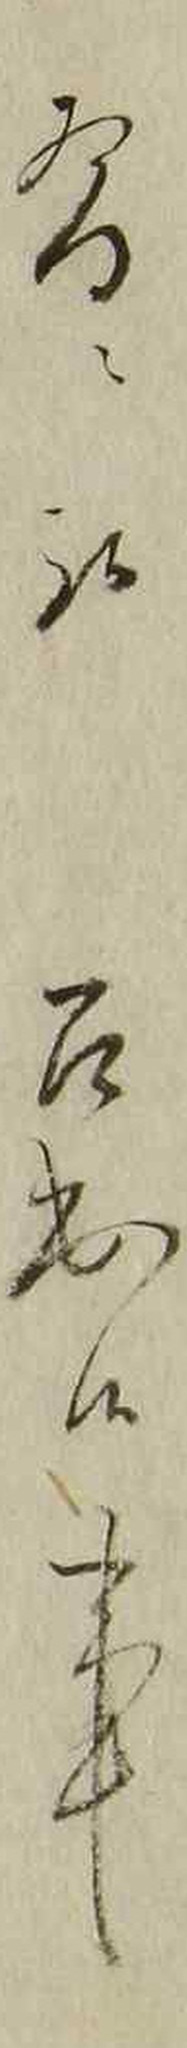習ニ被召出候事
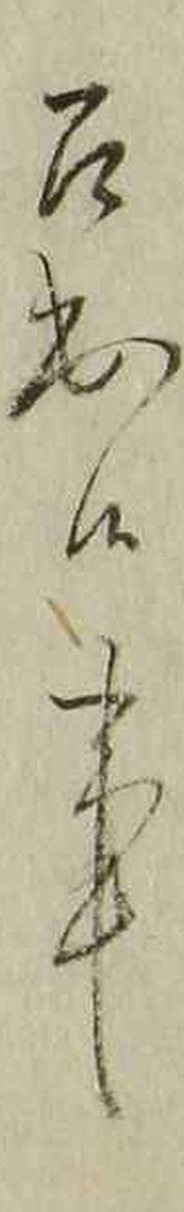召上候事
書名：諸士系譜　巻之8　い之部8
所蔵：会津若松市立会津図書館
